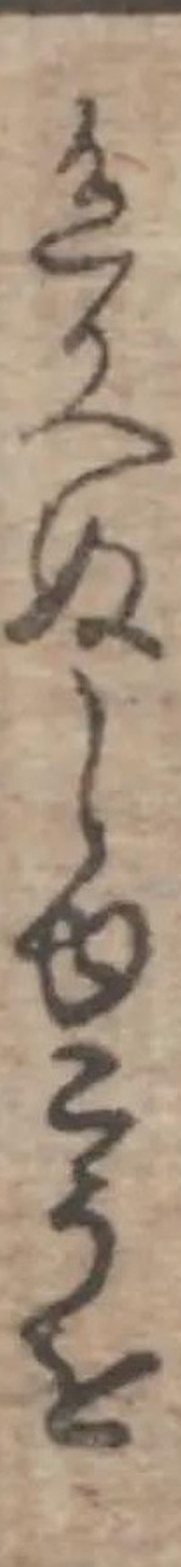色かへぬしゆこうを
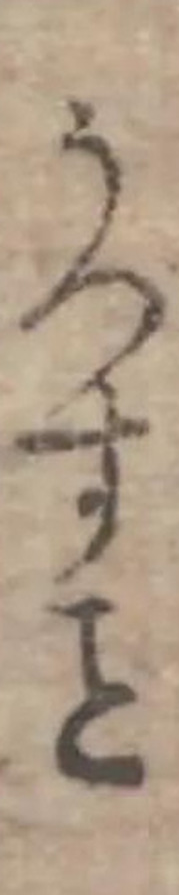うつすこと
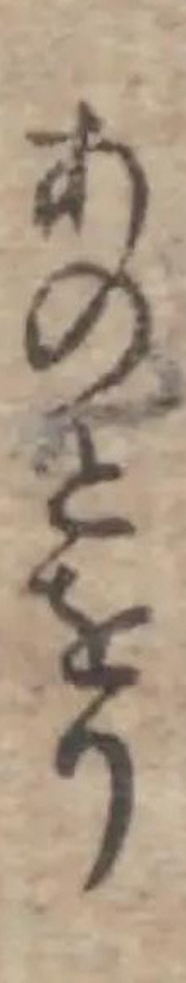あのとをり
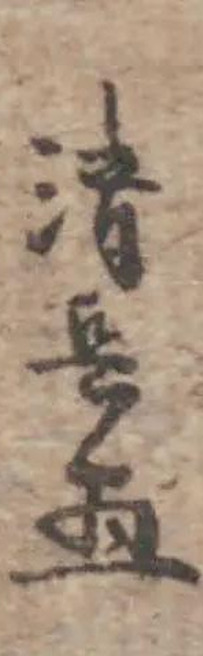清長画
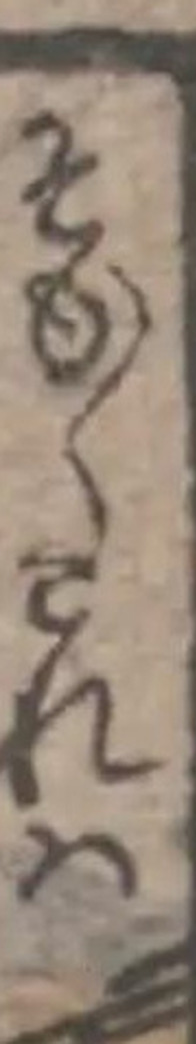そも〳〵これハ
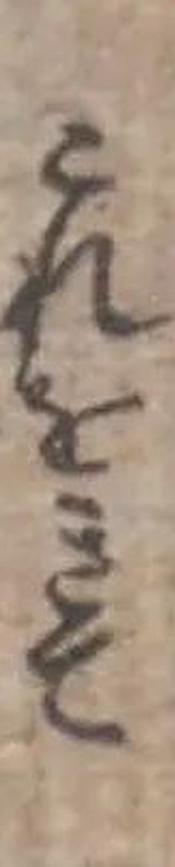これをきて
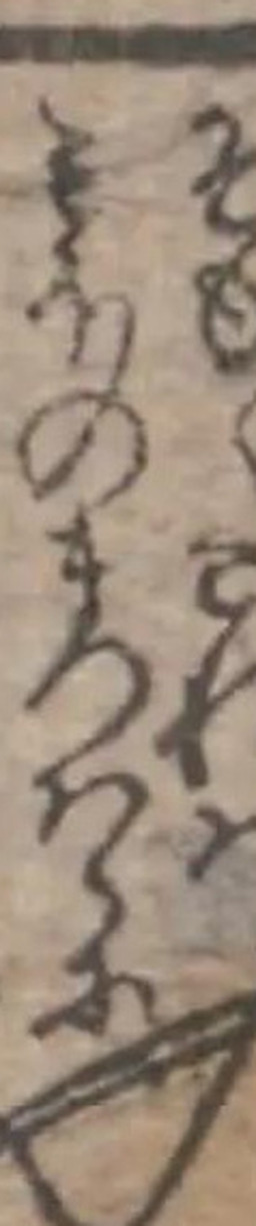ミほのまつハらに
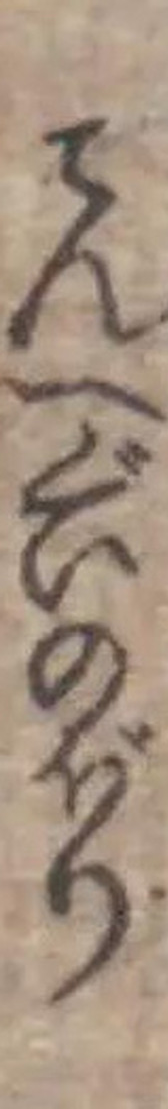てんへぐいのぼり
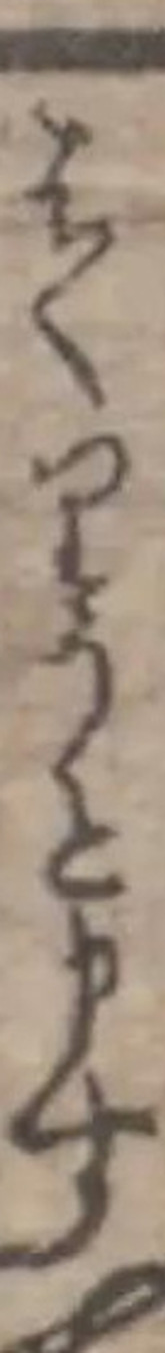はくうりうと申す
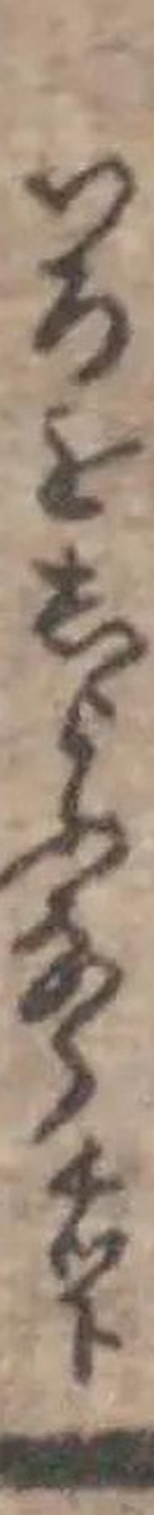いろをしらふなりチツト
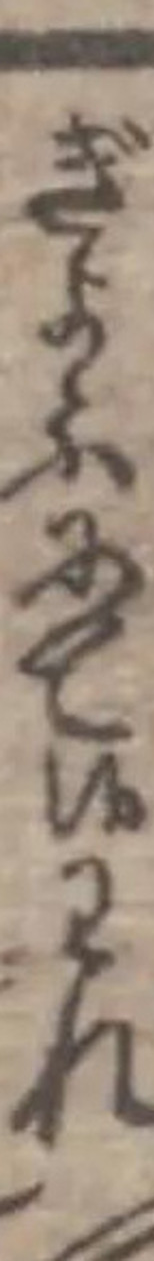ぎよふにて候われ
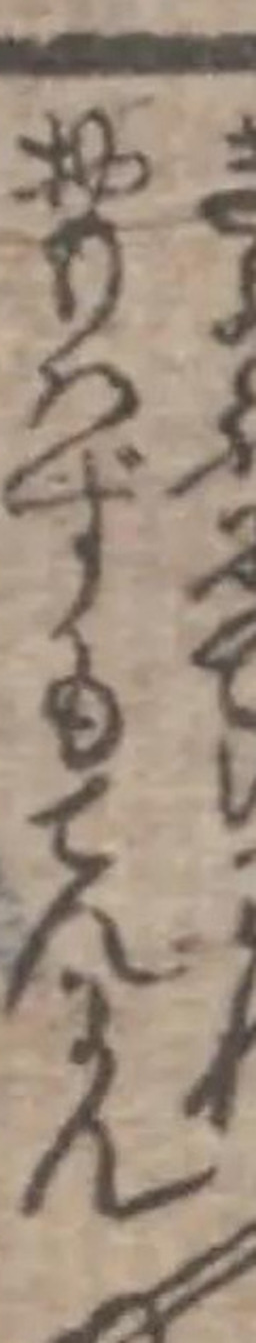おもハずもてんにん
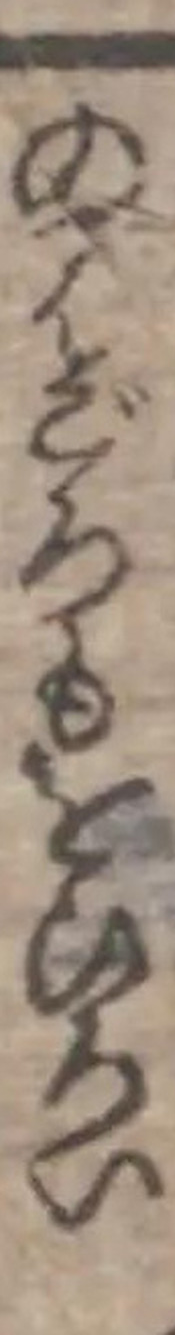のはごろもをひろひ
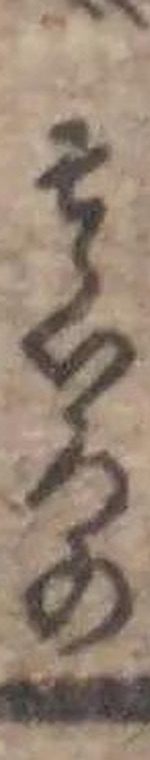そらいろの
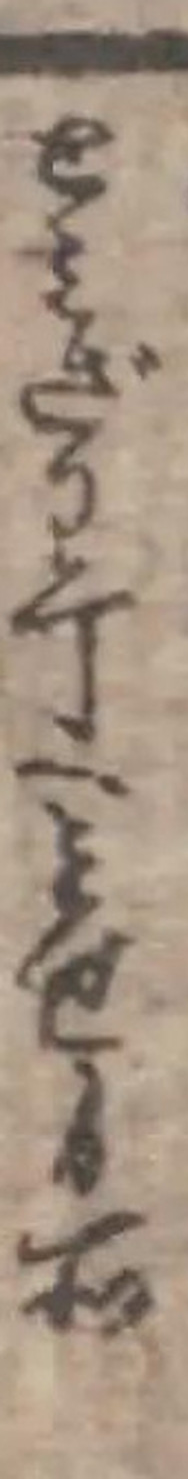とミざわ丁へミせ候所
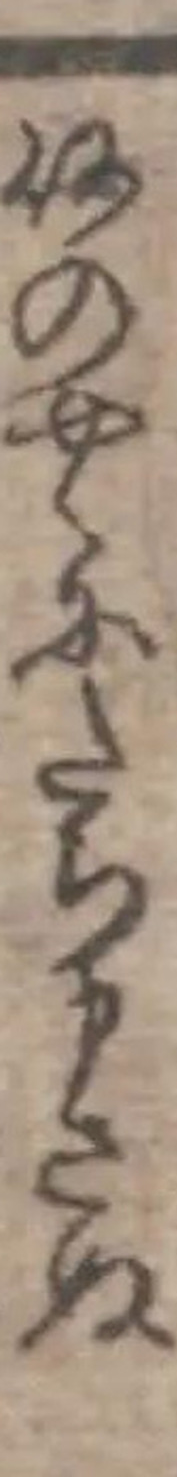何のやくにたち申さぬ
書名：草紙の曙 3巻
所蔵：国立国会図書館 National Diet Library, JAPAN
